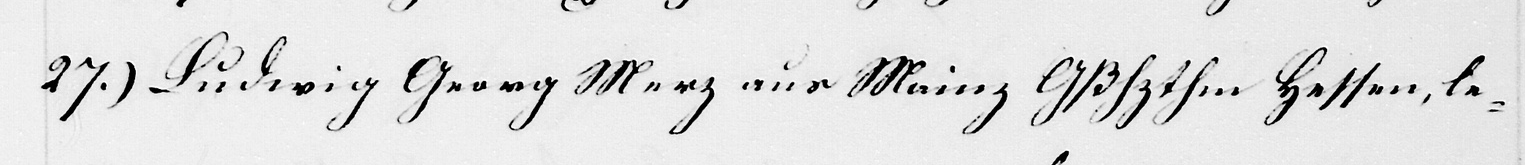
27.) Ludwig Georg Merz aus Mainz Gßhzthm Hessen, le¬
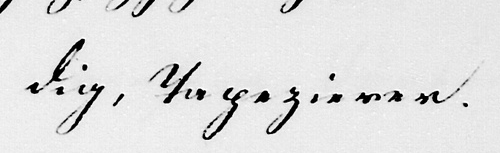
dig, Tapezierer.
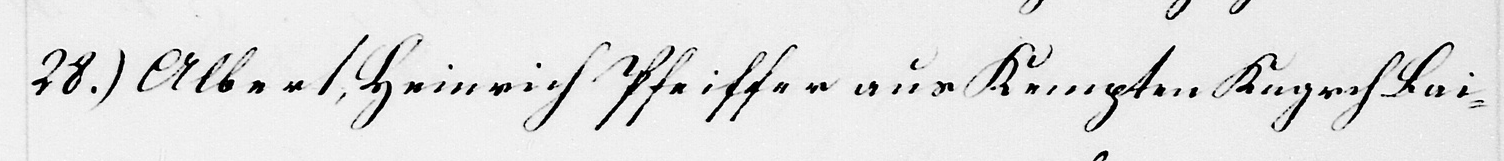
28.) Albert, Heinrich Pfeiffer aus Kempten Kngrch Bai¬
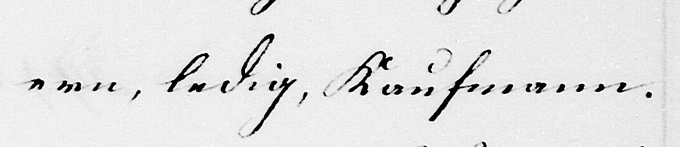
ern, ledig, Kaufmann.
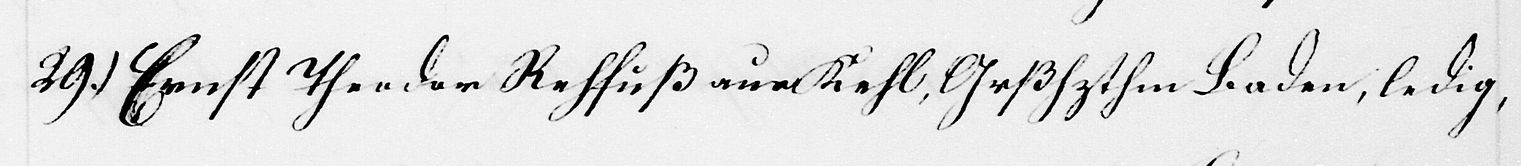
29.) Ernst Theodor Rehfuß aus Kehl, Grßhzthm Baden, ledig,
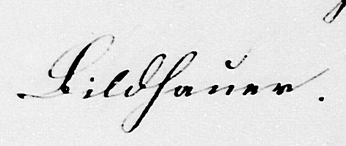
Bildhauer.
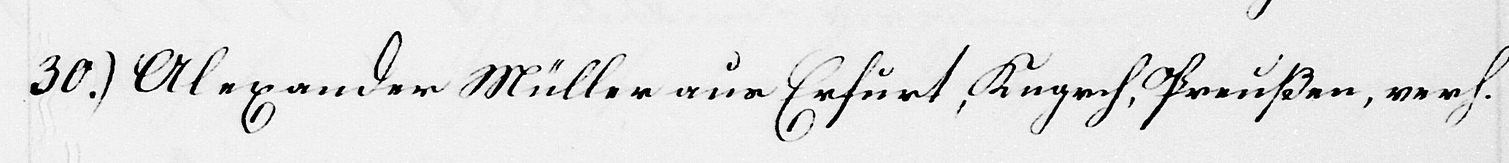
30.) Alexander Müller aus Erfurt, Kngrch, Preußen, verh.
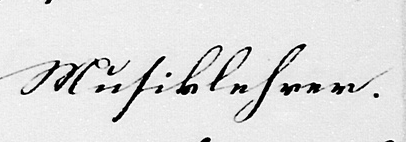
Musiklehrer.
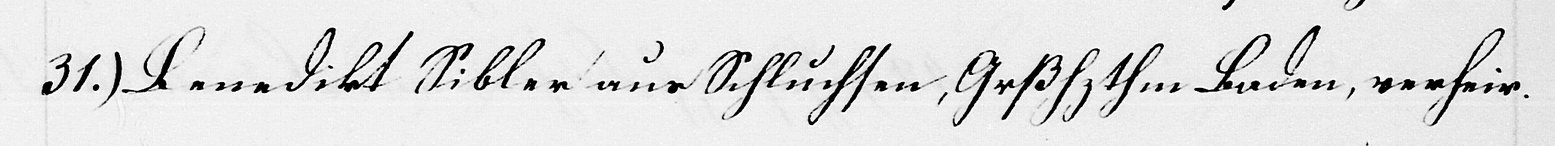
31.) Benedikt Sibler aus Schluchsen, Grßhzthm Baden, verheir.
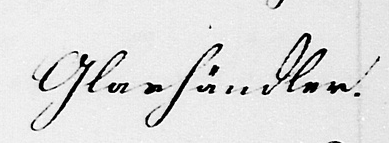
Glashändler.
